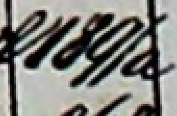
189/a
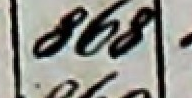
868
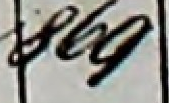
869
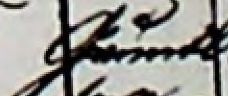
Grundt
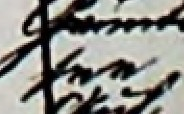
see
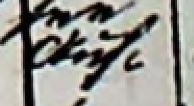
Aus„
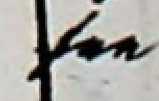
see
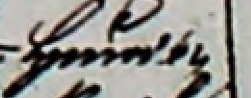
Hunds„
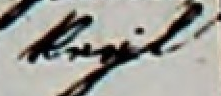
kogl
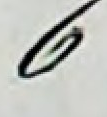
6
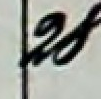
28
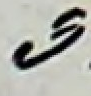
9
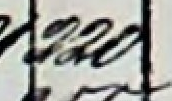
220
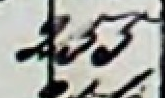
255
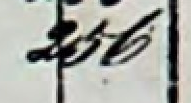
256
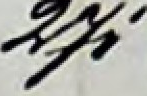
271
